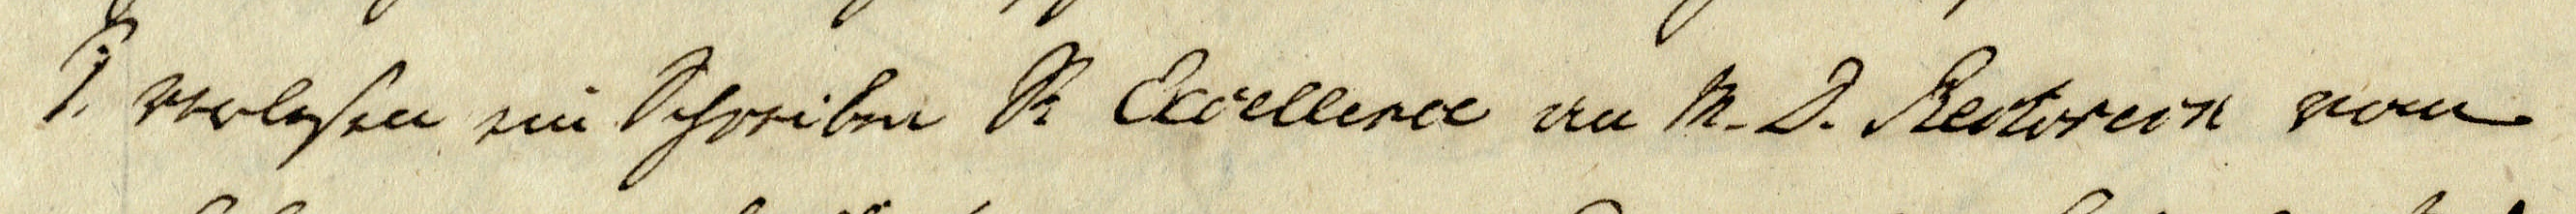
1. verlesen ein Schreiben Sr Excellence an M. D. Rectorem vom
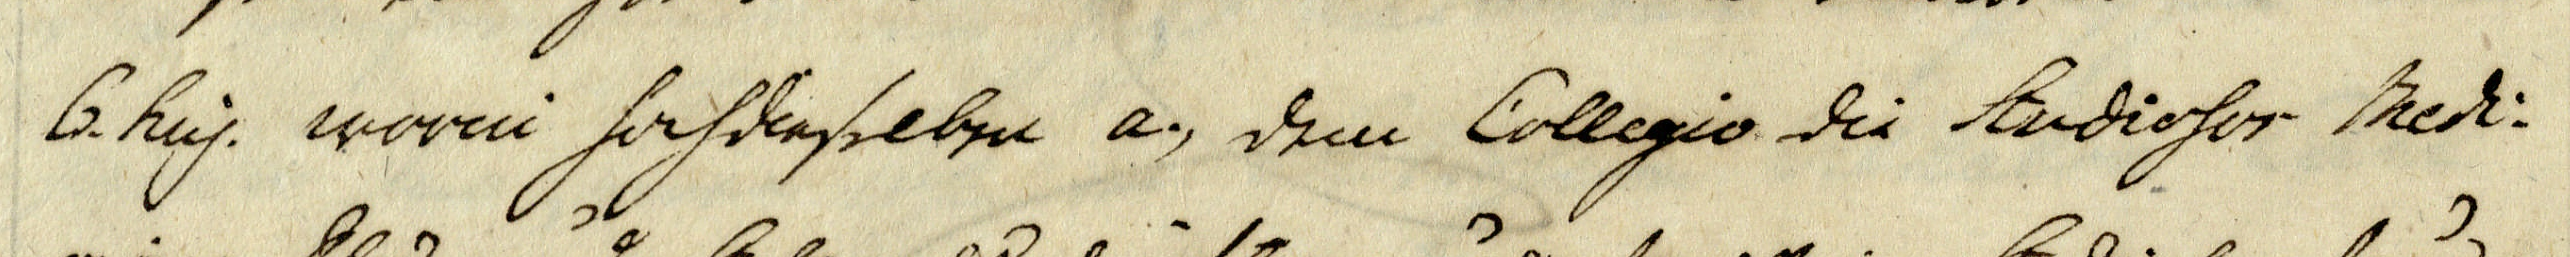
6 huj. worin Hochdieselben a, dem Collegio die Studiosos Medi¬
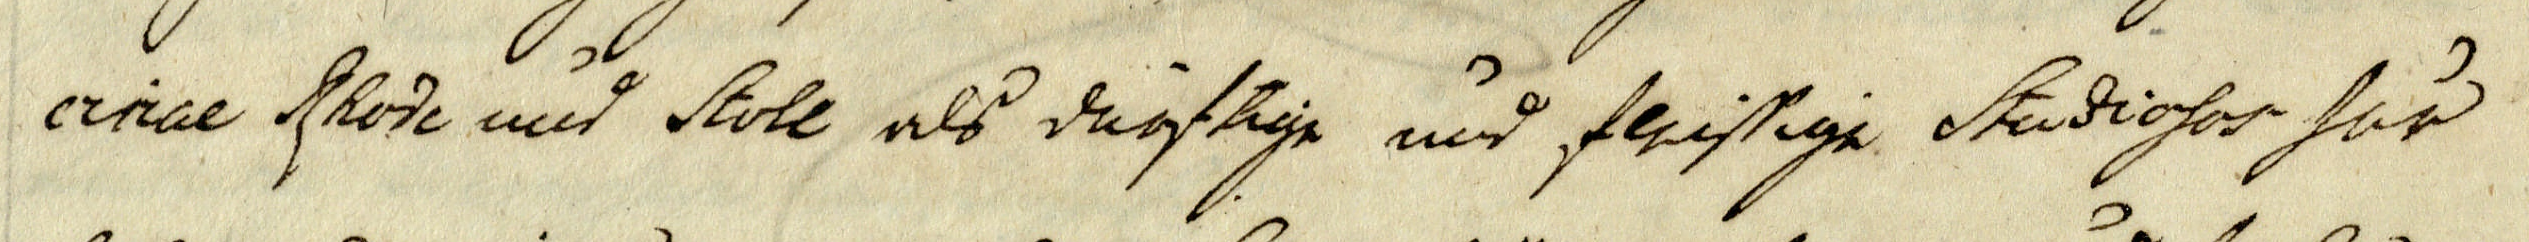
cinae Rhode und Stoll als dürftige und fleissigen Studiosos zur
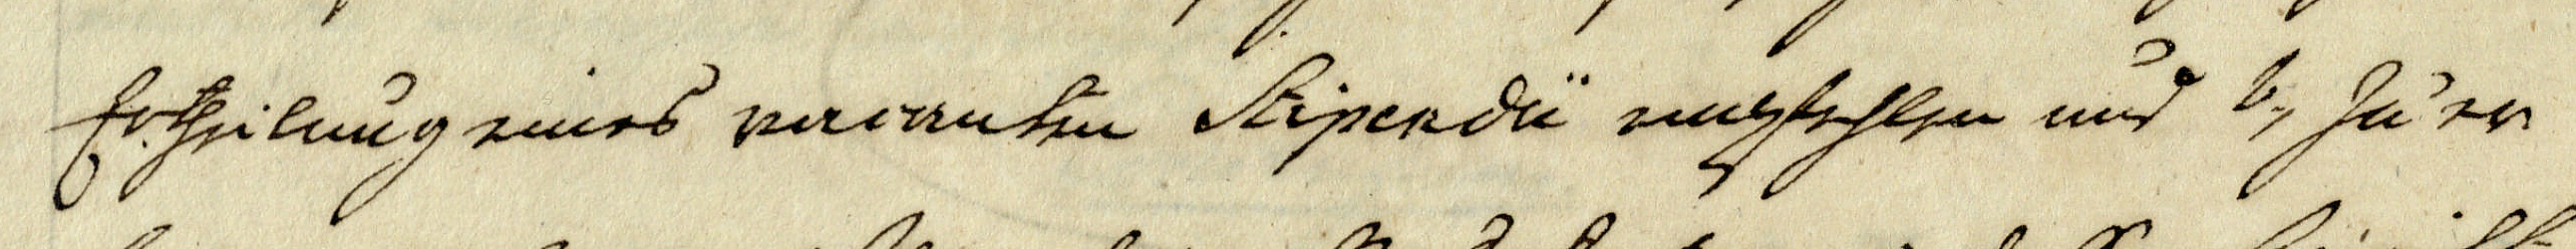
Ertheilung eines vacanten Stipendii empfehlen und b, zu er¬
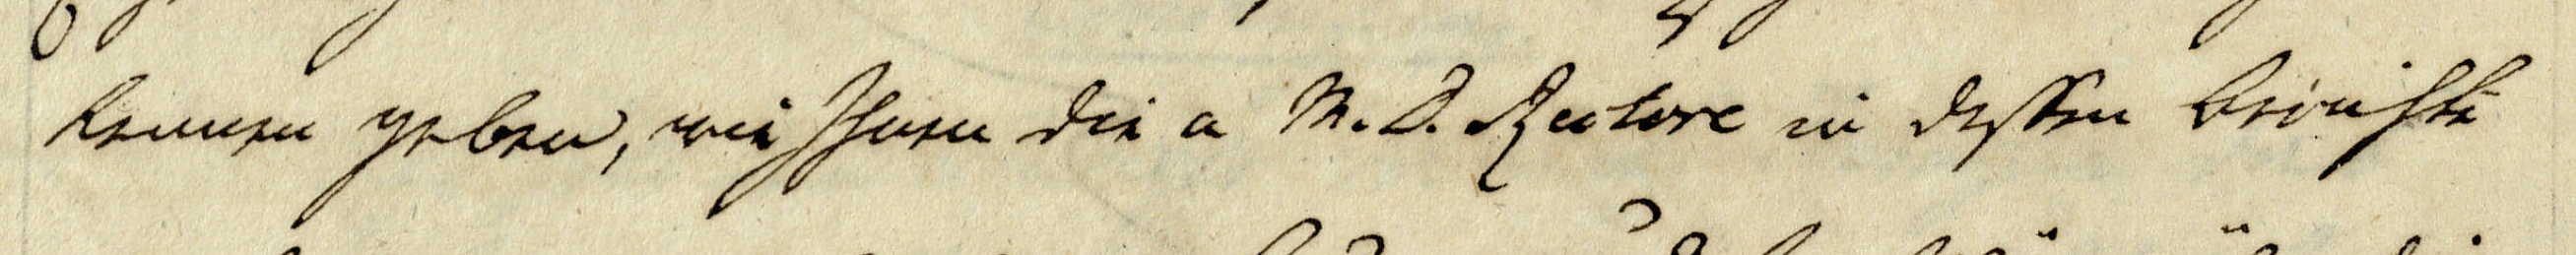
kennen geben, wie Ihnen die a M. D. Rectore in dessen Berichte
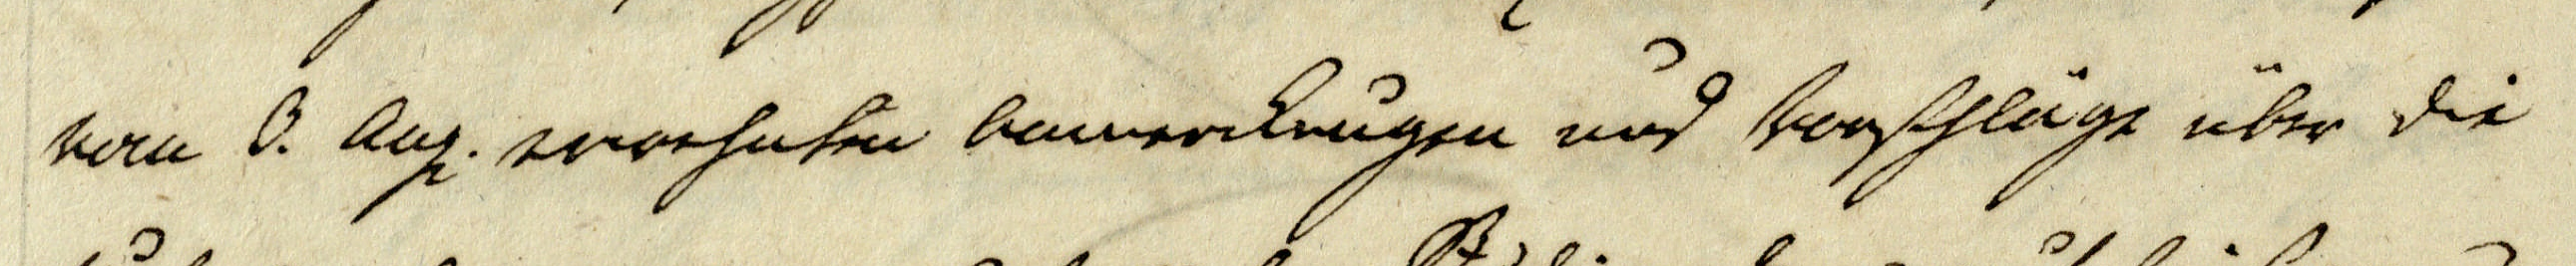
vom 3. Aug. erwehnten Anmerckungen und Vorschläge über die
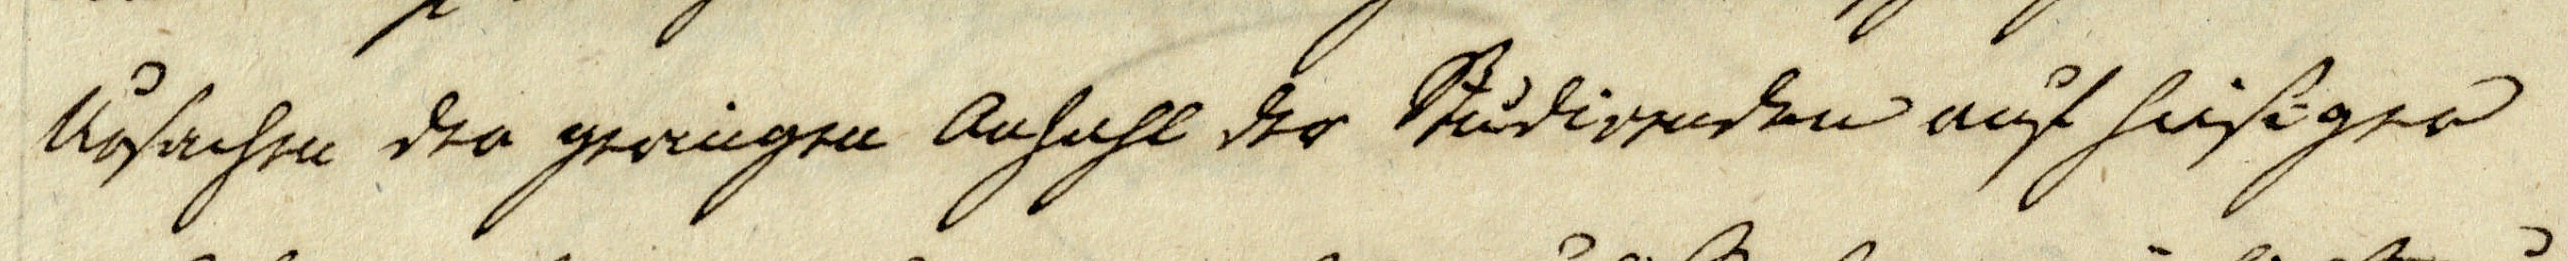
Ursachen der geringen Anzahl der Studirenden auf hiesiger
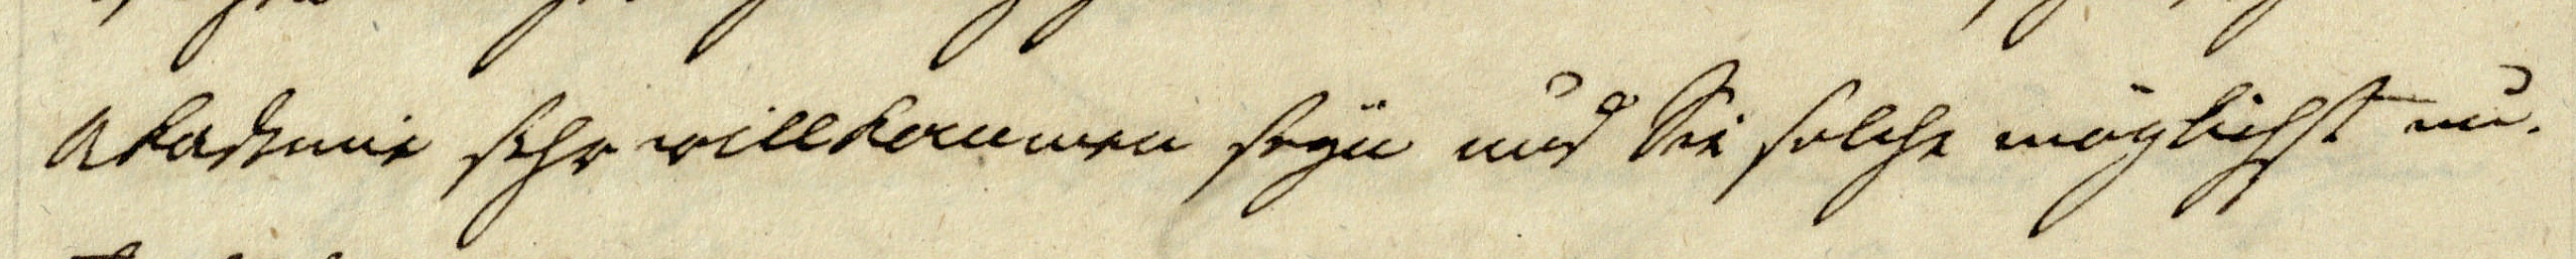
Akademie sehr willkommen seÿn und Sie solche möglichst un¬
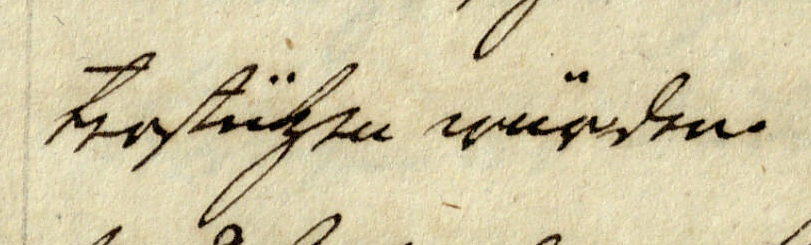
terstützen würden.
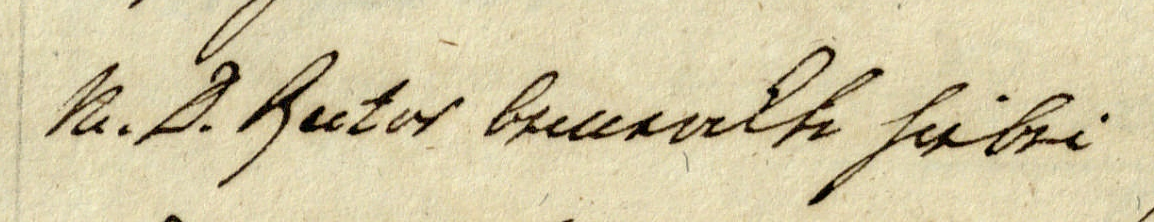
M. D. Rector bemerckte hiebei
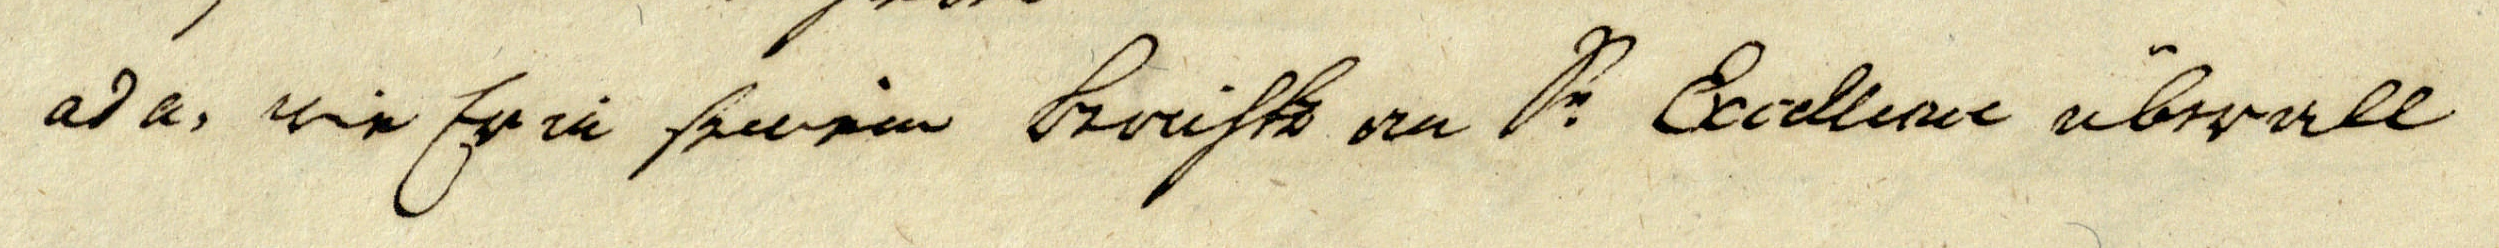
ad a, wie Er in seinem Berichte an Sr Excellence überall
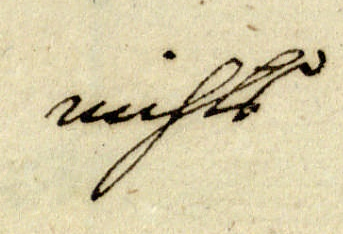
nichts
